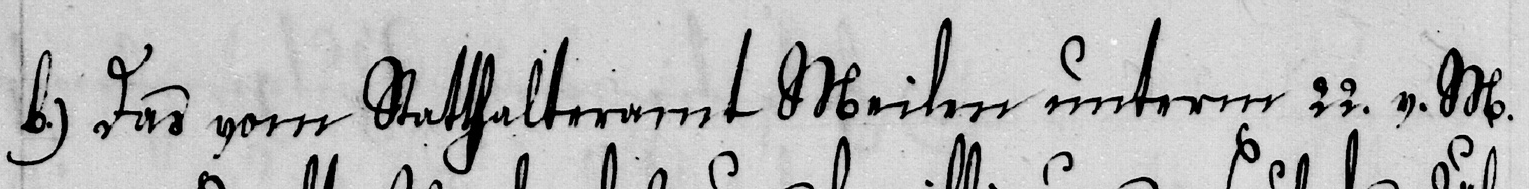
b.) Das vom Statthalteramt Meilen unterm 22. v. M.
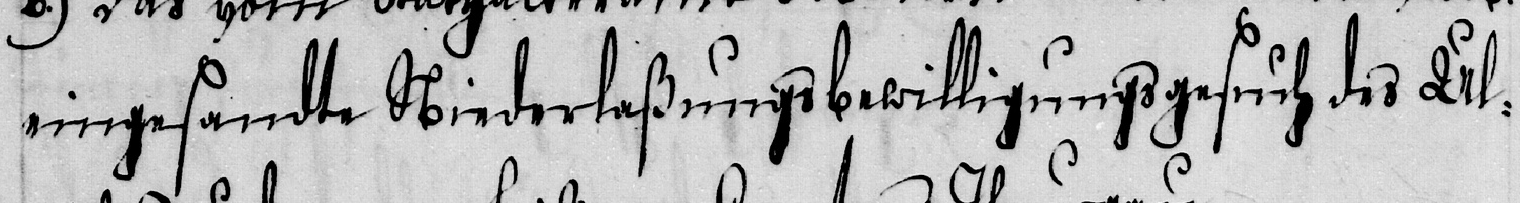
eingesandte Niederlaßungsbewilligungsgesuch des Ul¬
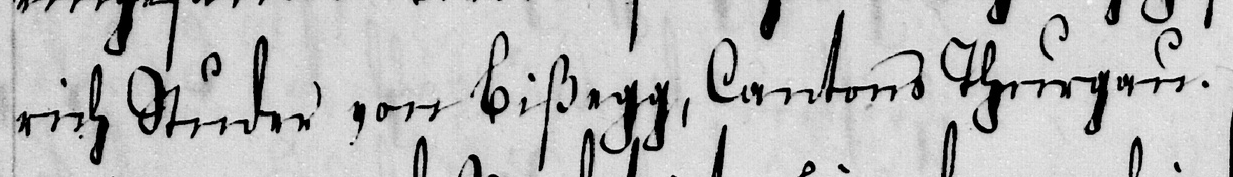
rich Studer von Bißegg, Cantons Thurgau.
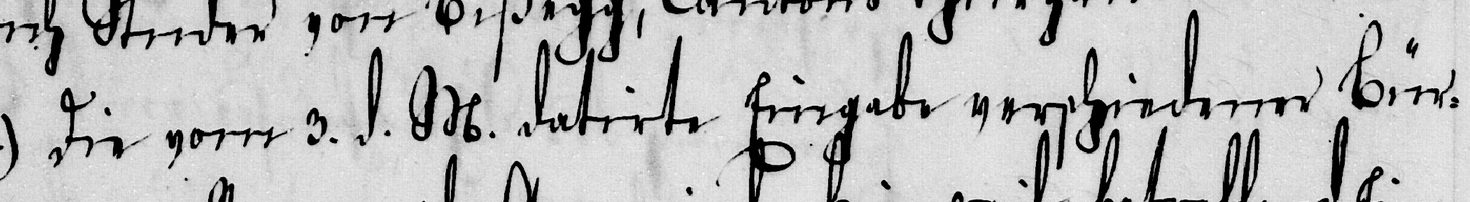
Die vom 3. d. M. datirte Eingabe verschiedener Bür¬
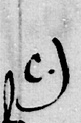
c.)
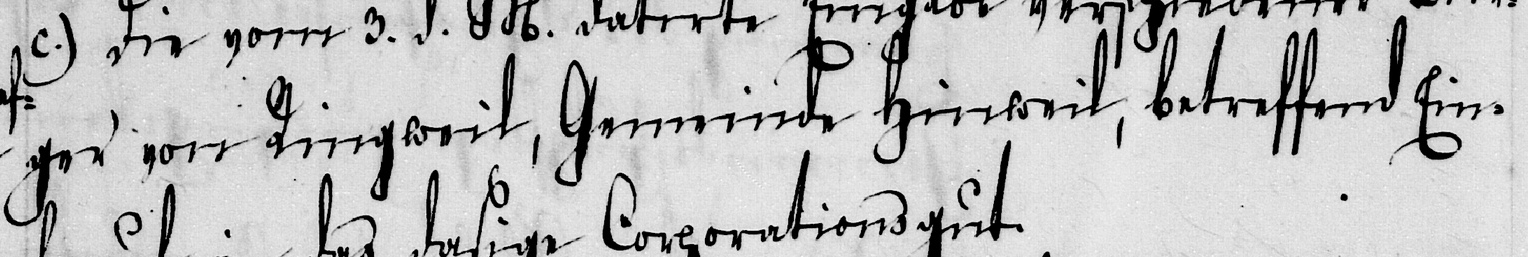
ger von Ringweil, Gemeinde Hinweil, betreffend Ein¬
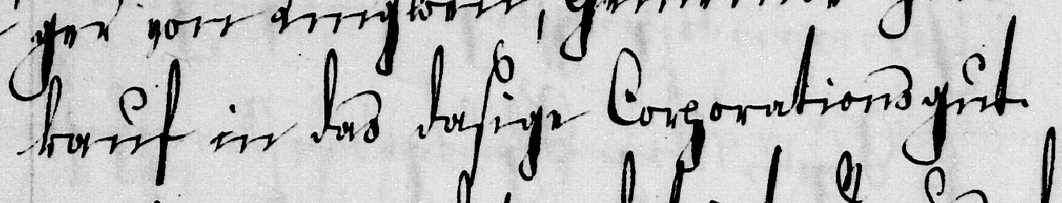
kauf in das dasige Corporationsgut.
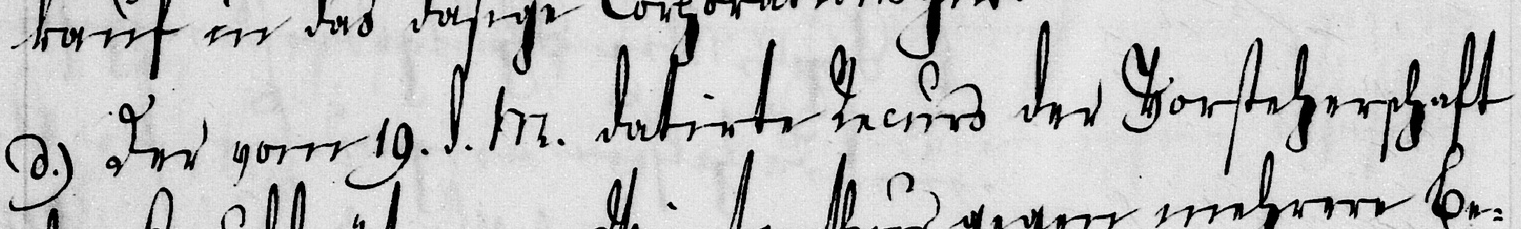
d.) Der vom 10. d. M. datirte Recurs der Vorsteherschaft
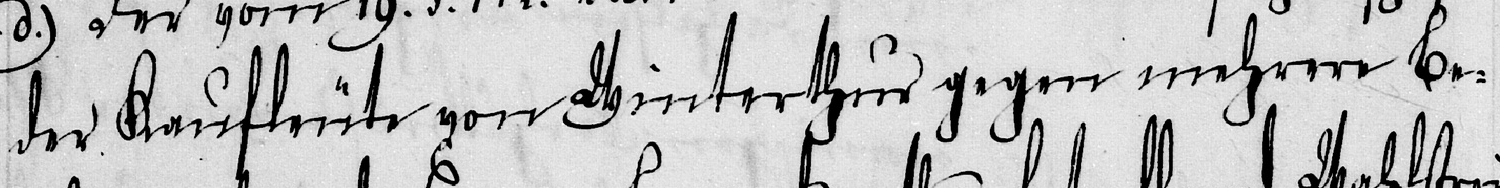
der Kaufleute von Winterthur gegen mehrere Be¬
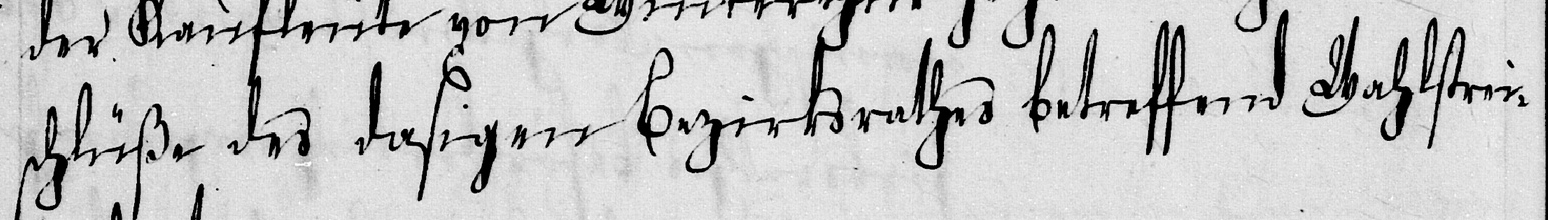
schlüße des dasigen Bezirksrathes betreffend Wahlstre¬
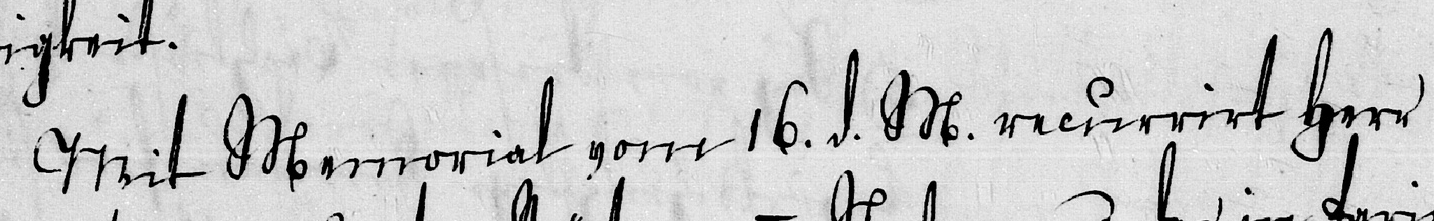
Mit Memorial vom 16. d. M. recurrirt Herr
